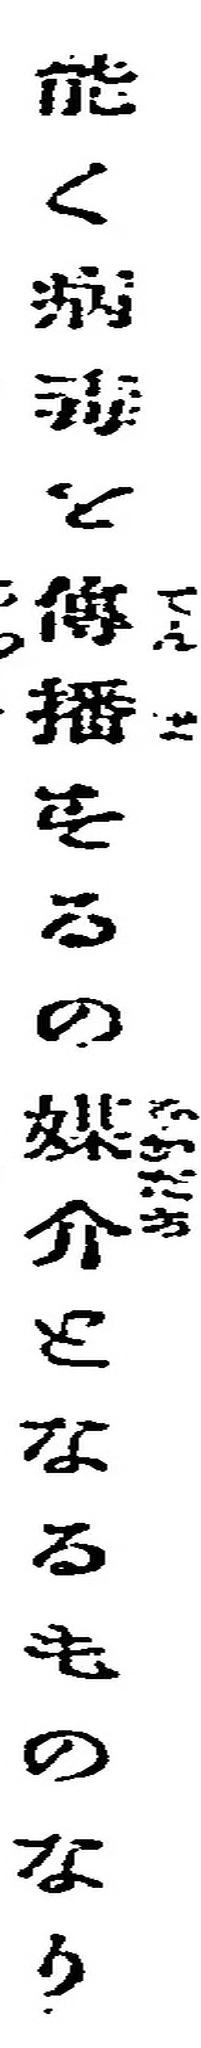能く病毒を伝播するの媒介となるものなり
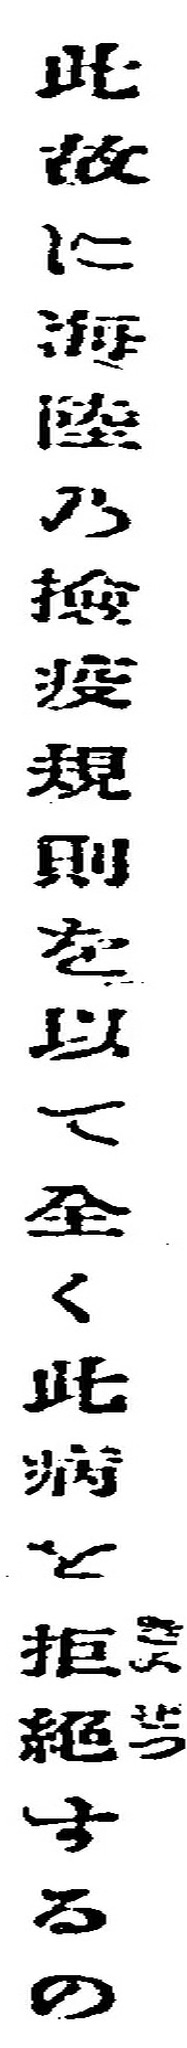此故に海陸の撿疫規則を以て全く此病を拒絶するの
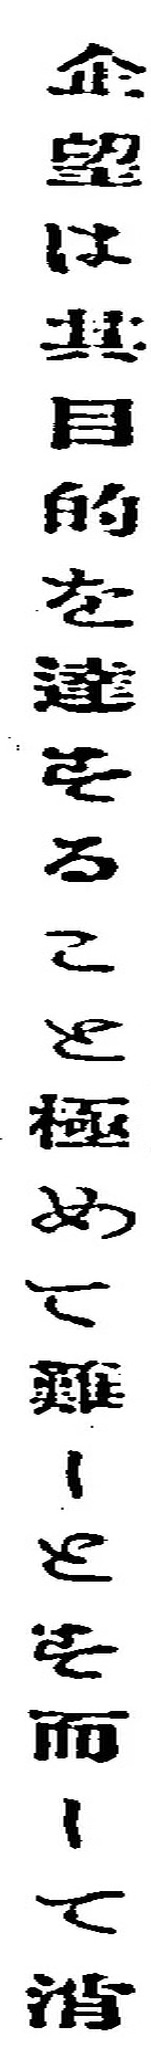企望は其目的を達すること極めて難しとす而して消
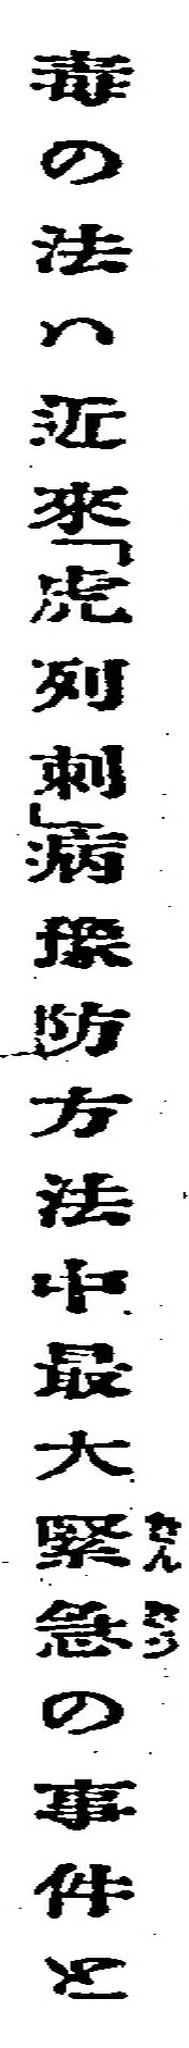毒の法は近来「虎列刺」病予防方法中最大緊急の事件と
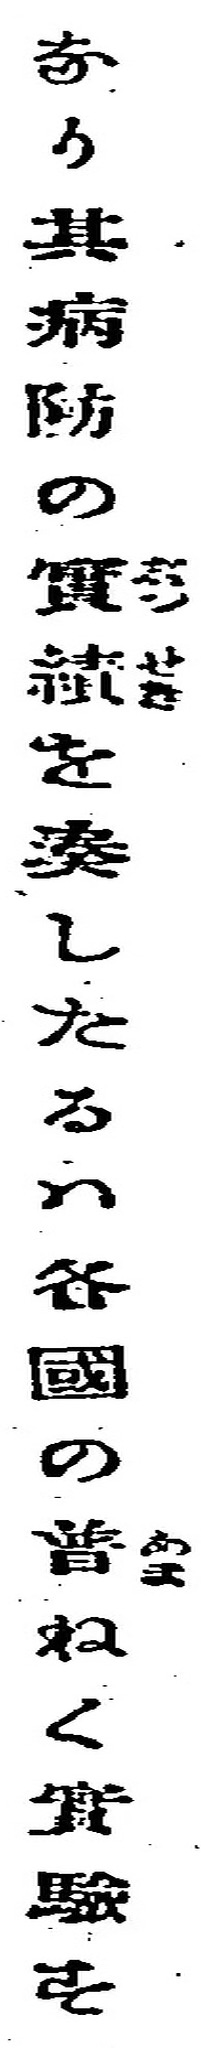なり其病防の実績を奏したるは各国の普ねく実験す
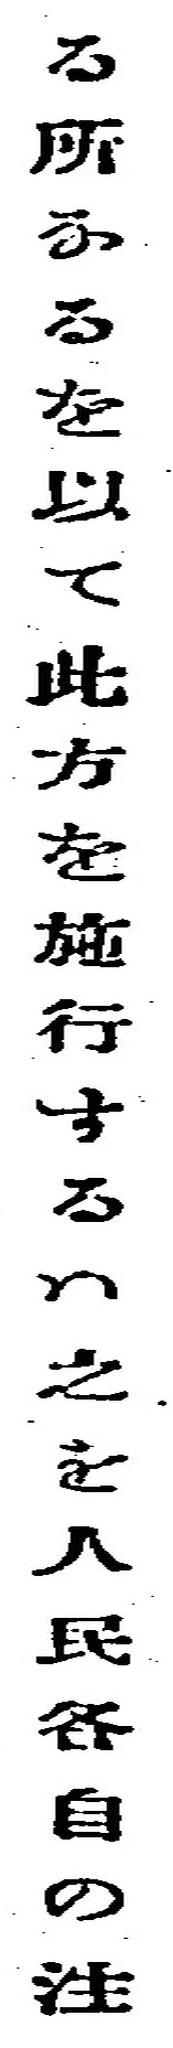る所なるを以て此方を施行するは之を人民各自の注
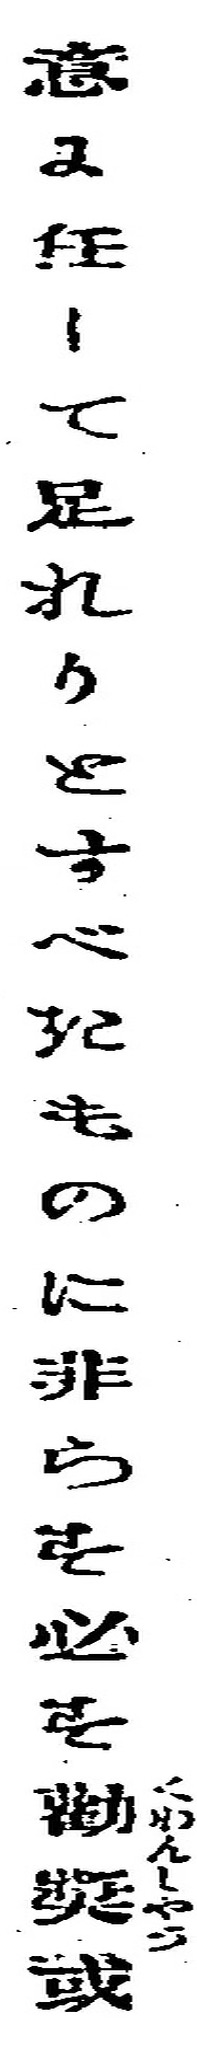意に任して足れりとすべきものに非らす必す勧奨或
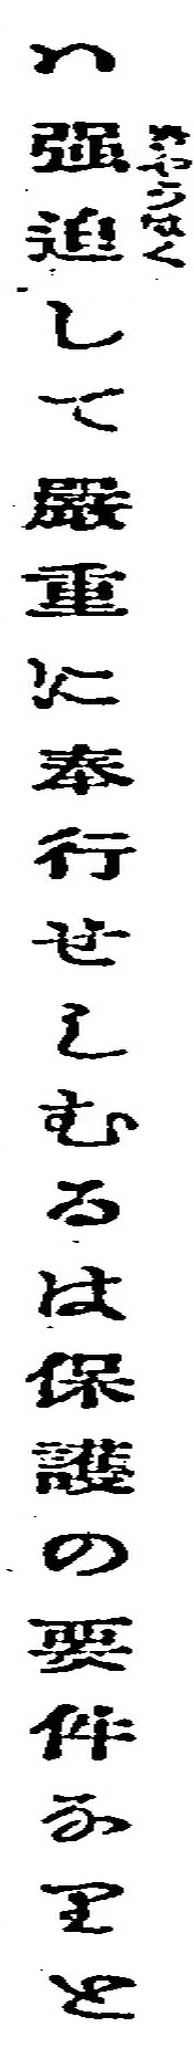は強迫して厳重に奉行せしむるは保護の要件なりと
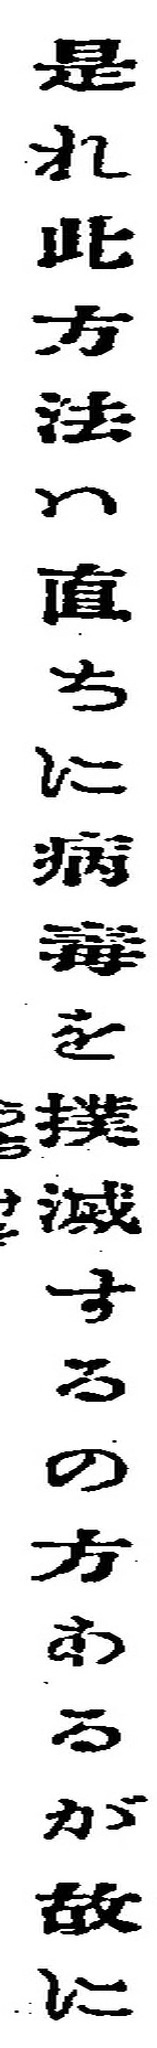是れ此方法は直ちに病毒を撲滅するの方あるが故に
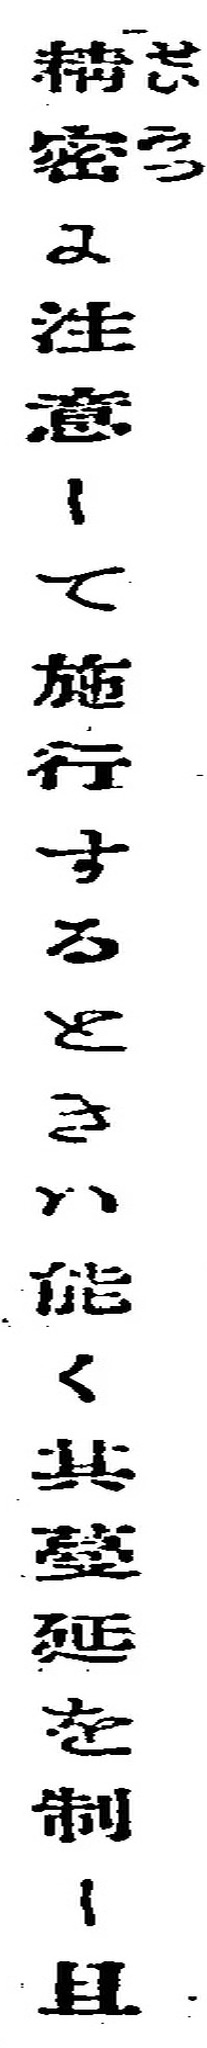精密に注意して施行するときは能く其蔓延を制し且
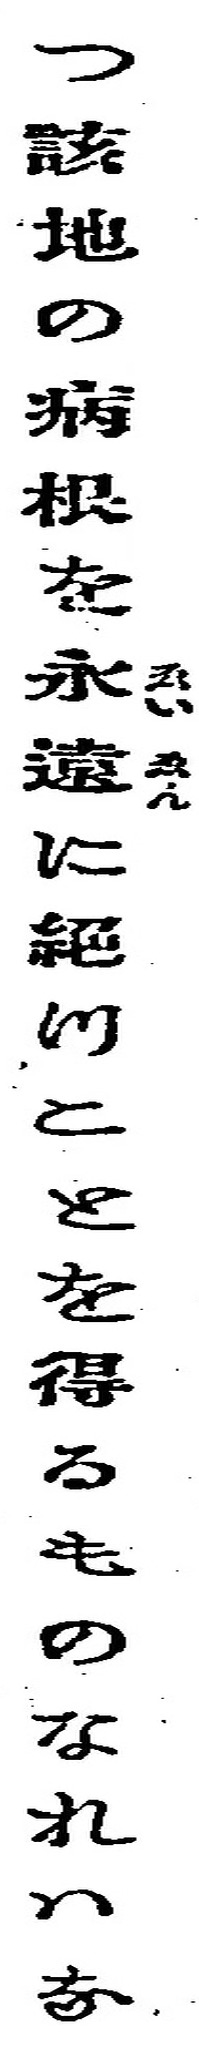つ該地の病根を永遠に絶つことを得るものなれはな
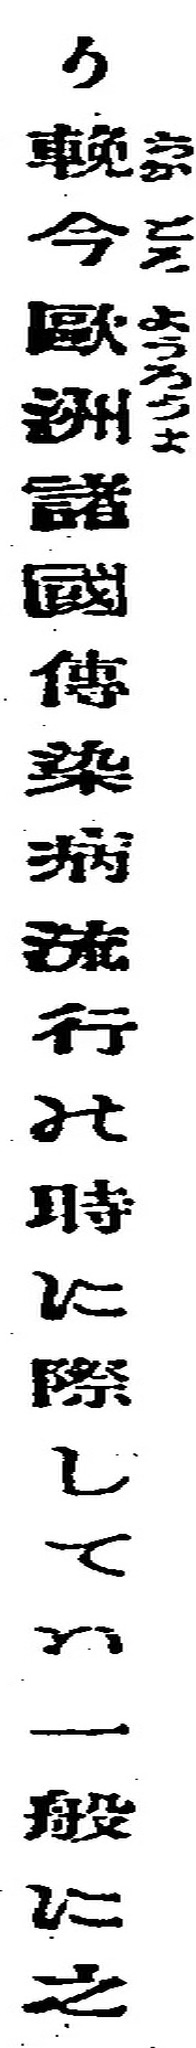り輓今欧洲諸国伝染病流行の時に際しては一般に之
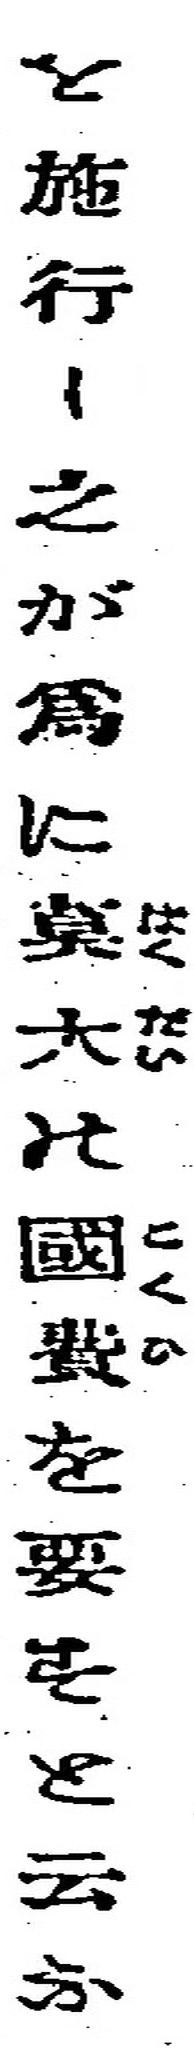を施行し之が為に莫大の国費を要すと云ふ

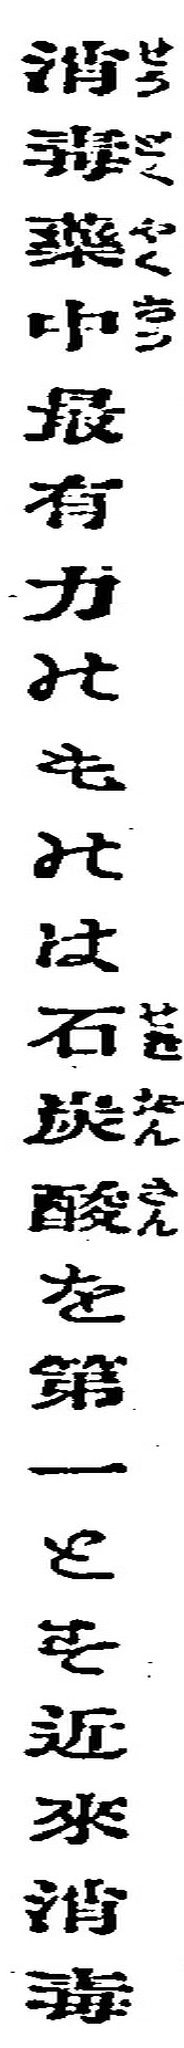消毒薬中最有力のものは石炭酸を第一とす近来消毒
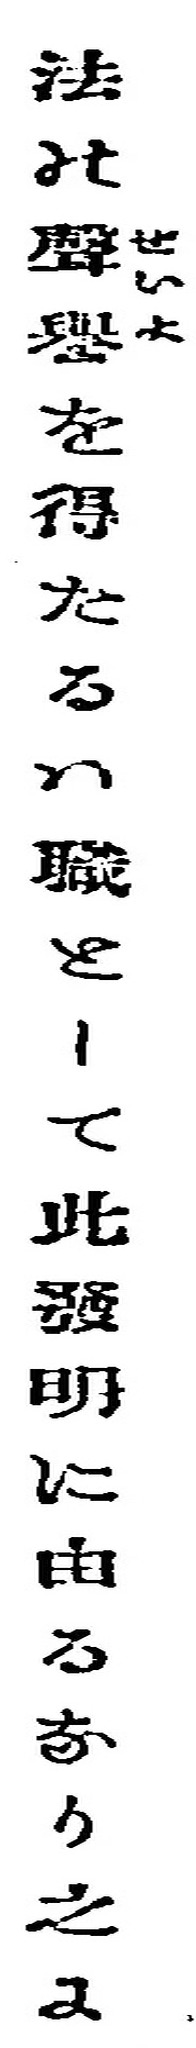法の声誉を得たるは職として此発明に由るなり之に
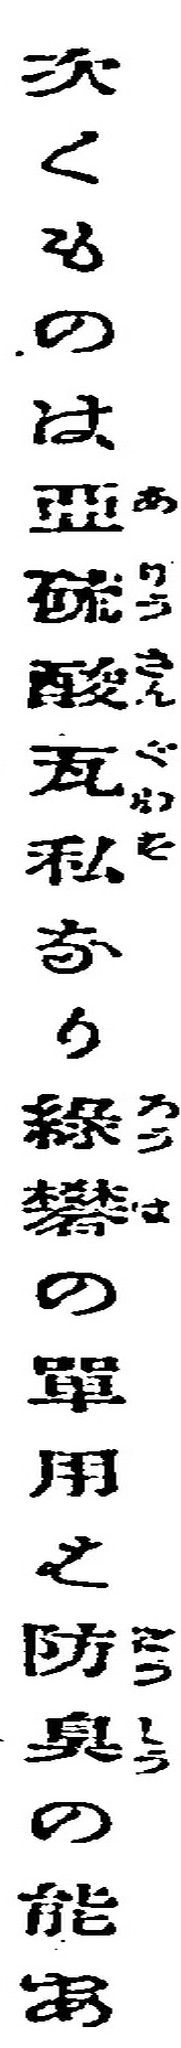次くものは亜硫酸瓦私なり緑礬の単用は防臭の能あ
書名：これら病予防心得
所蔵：国立国会図書館 National Diet Library, JAPAN
